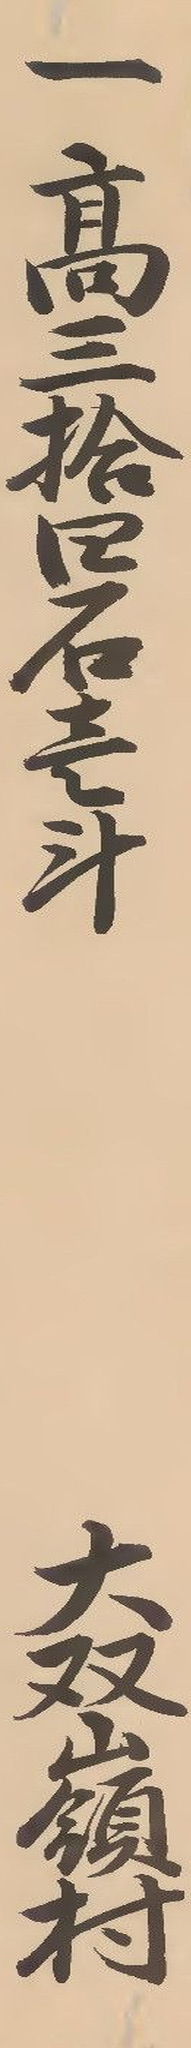一高三拾四石壱斗大双嶺村
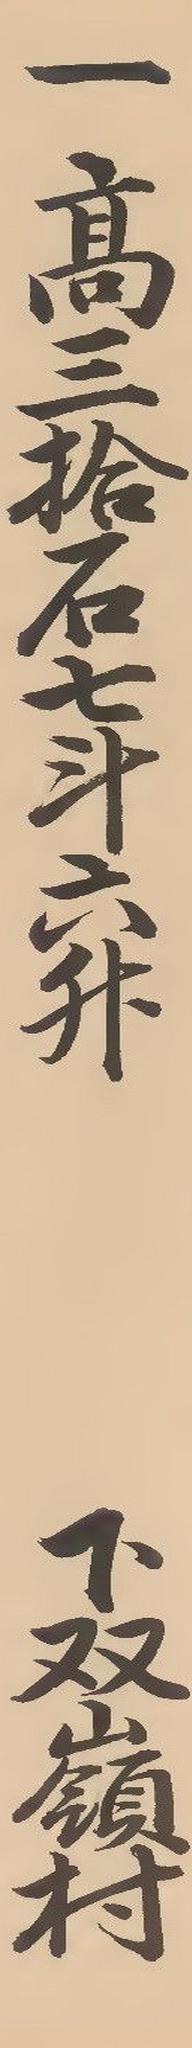一高三拾石七斗六升下双嶺村
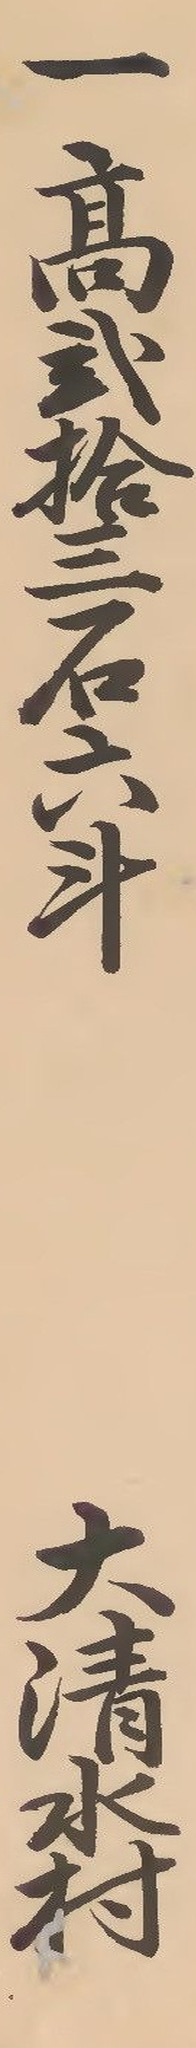一高弐拾三石六斗大清水村

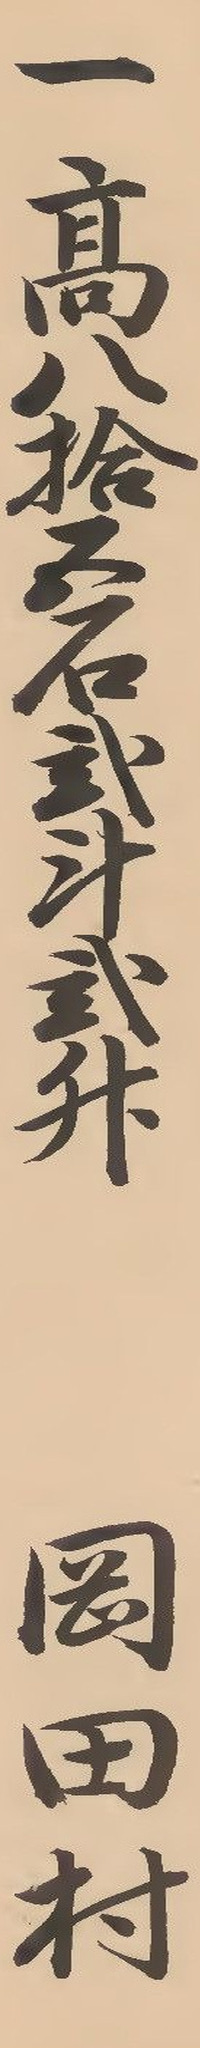一高八拾五石弐斗弐升岡田村
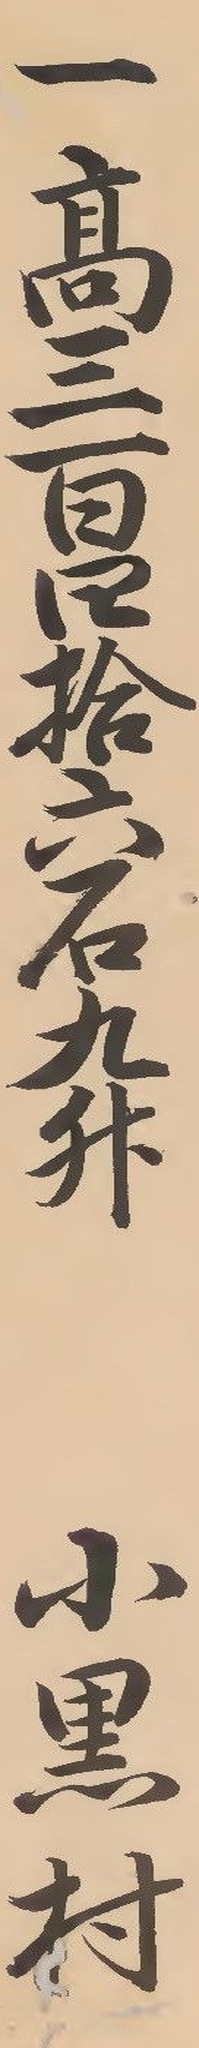一高三百四拾六石九升小黒村

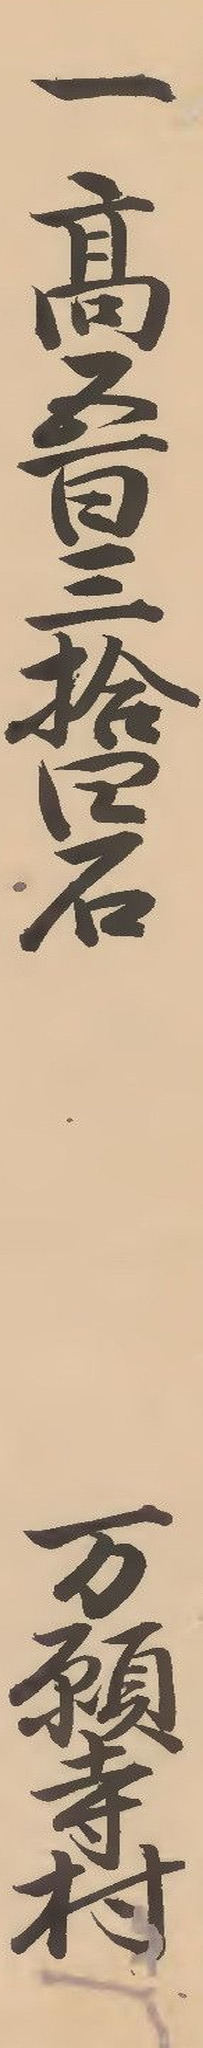一高五百三拾四石万願寺村
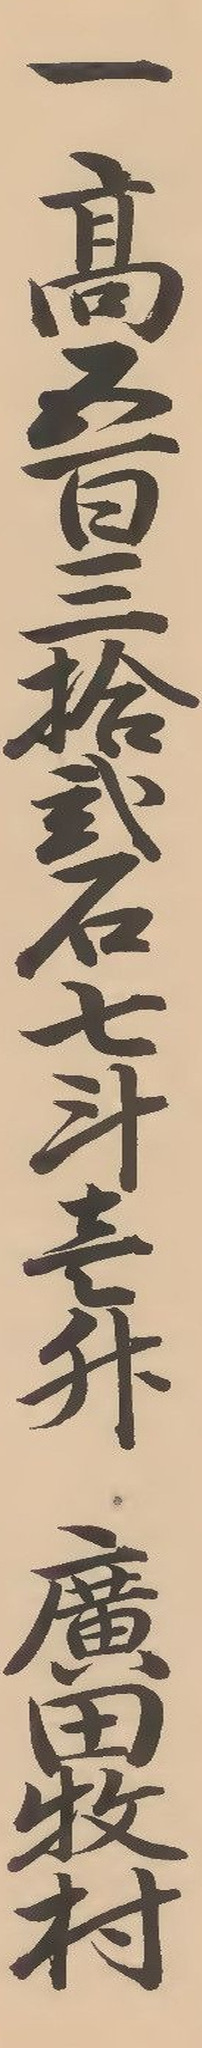一高五百三拾弐石七斗壱升広田牧村
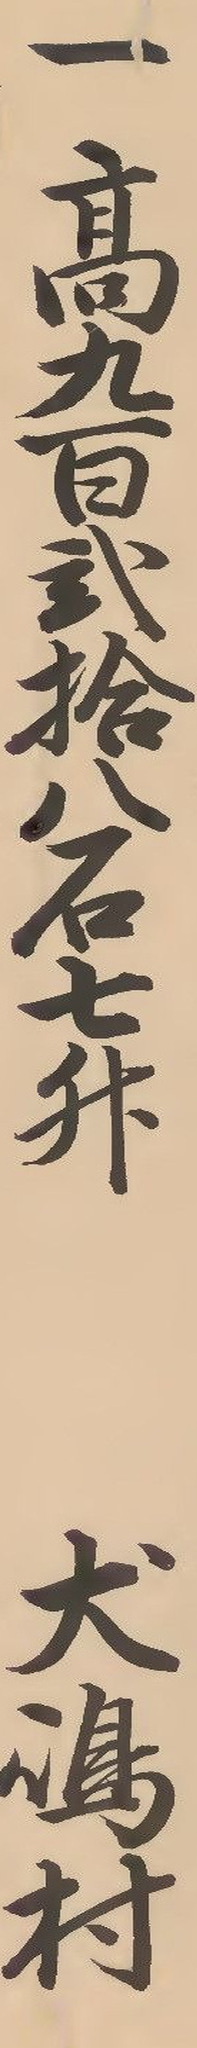一高九百弐拾八石七升犬島村
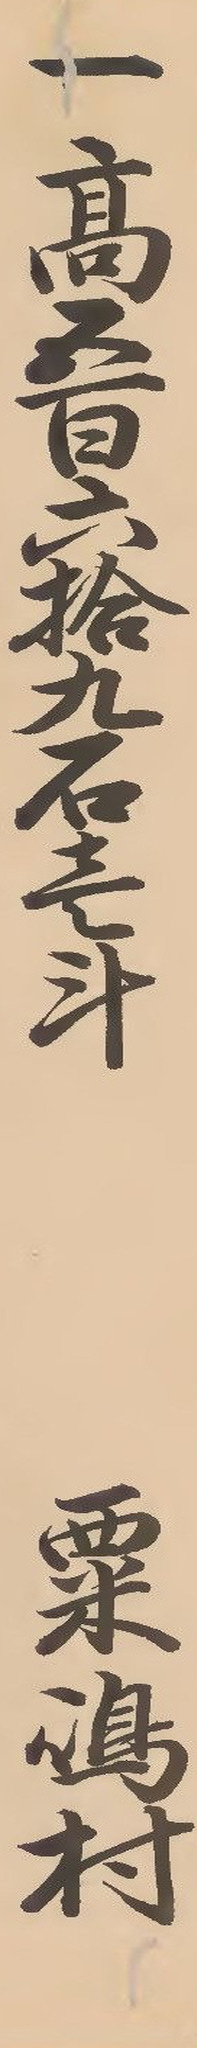一高五百六拾九石壱斗粟島村
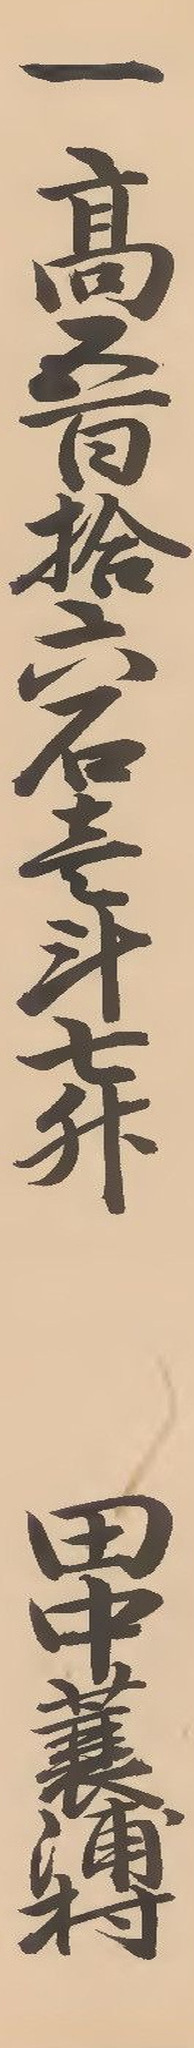一高五百拾六石壱斗七升田中箕浦村
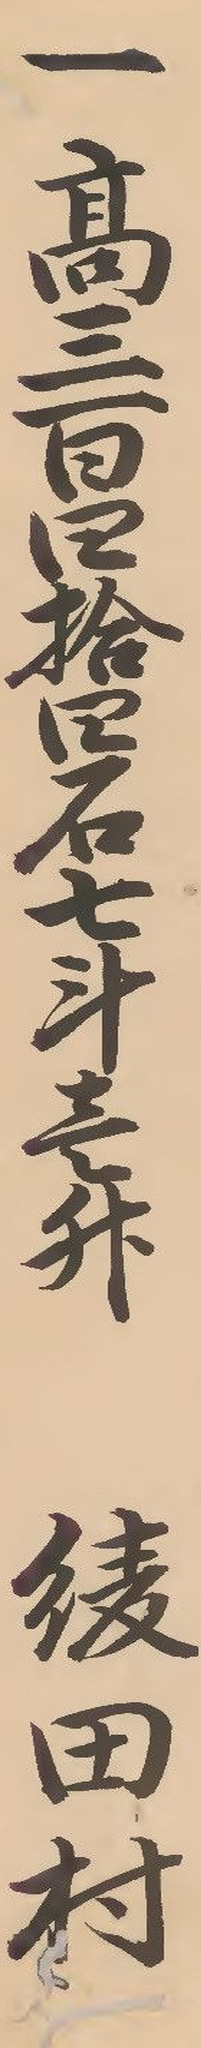一高三百四拾四石七斗壱升綾田村

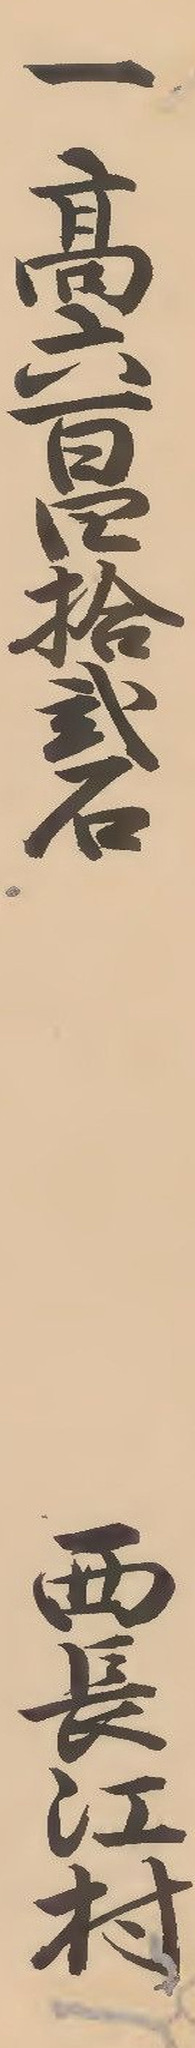一高六百四拾弐石西長江村
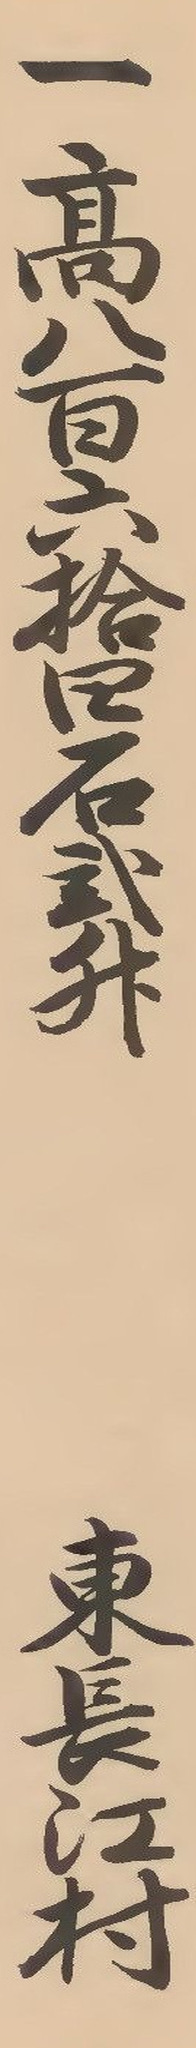一高八百六拾四石弐升東長江村
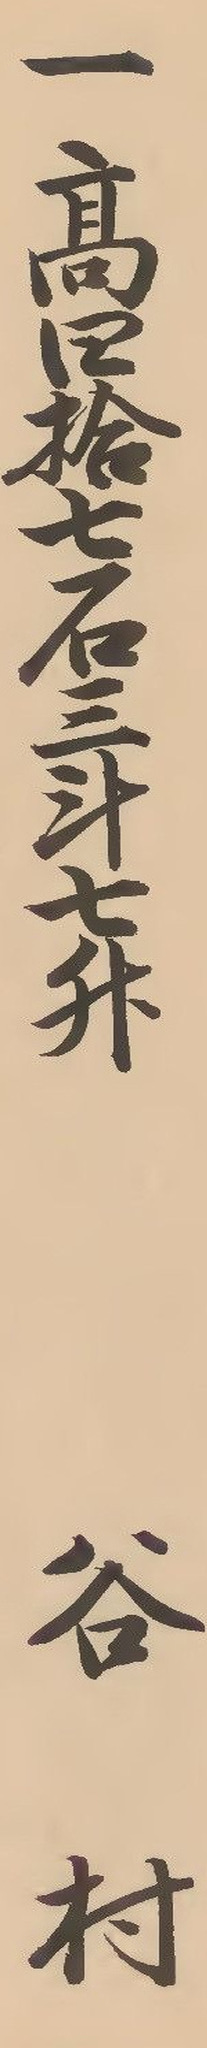一高四拾七石三斗七升谷村
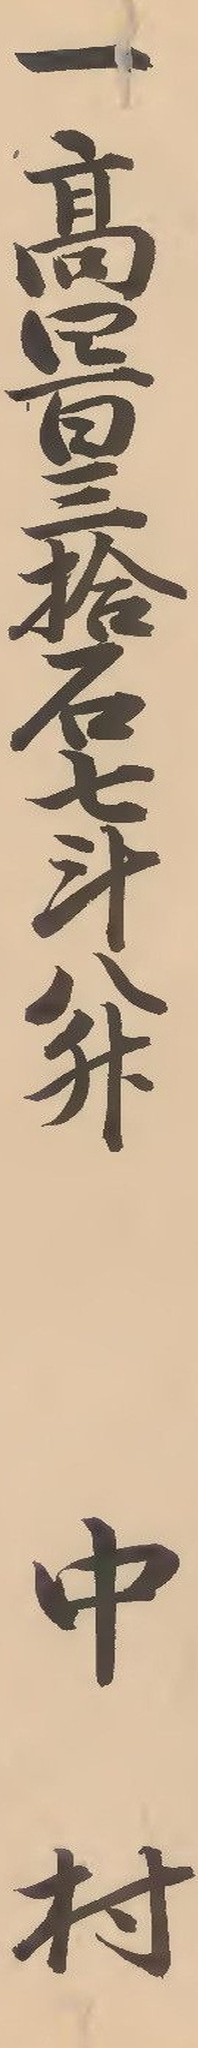一高四百三拾石七斗八升中村

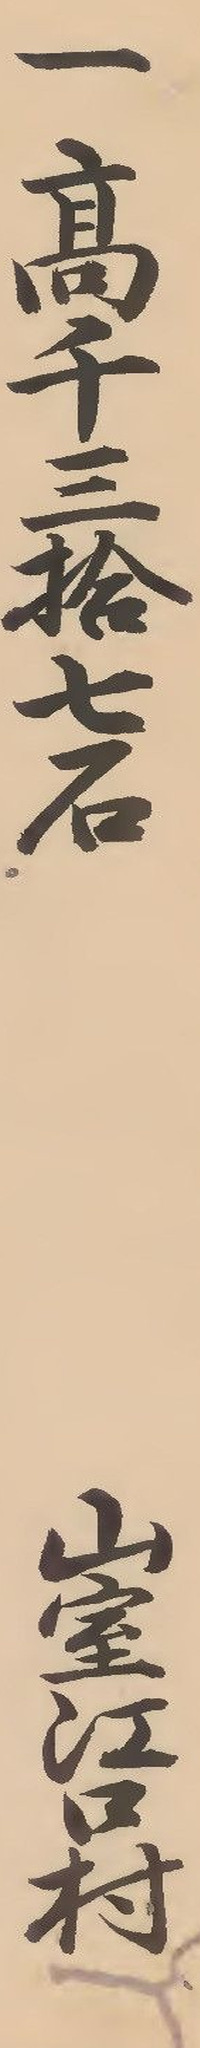一高千三拾七石山室江口村
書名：越中国郷帳
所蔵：国立公文書館 National Archives of Japan
